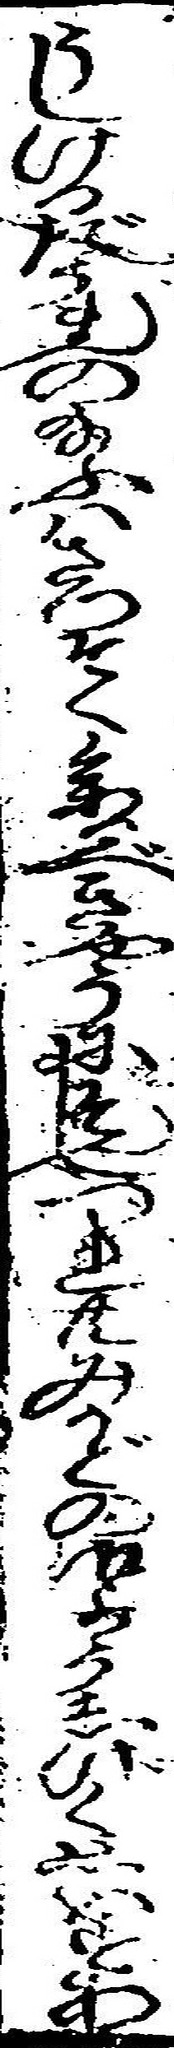うしけるだうまんの給ふはさつそく参るべきやうにそんしつれ共みかどの御ようしげく思はすあ
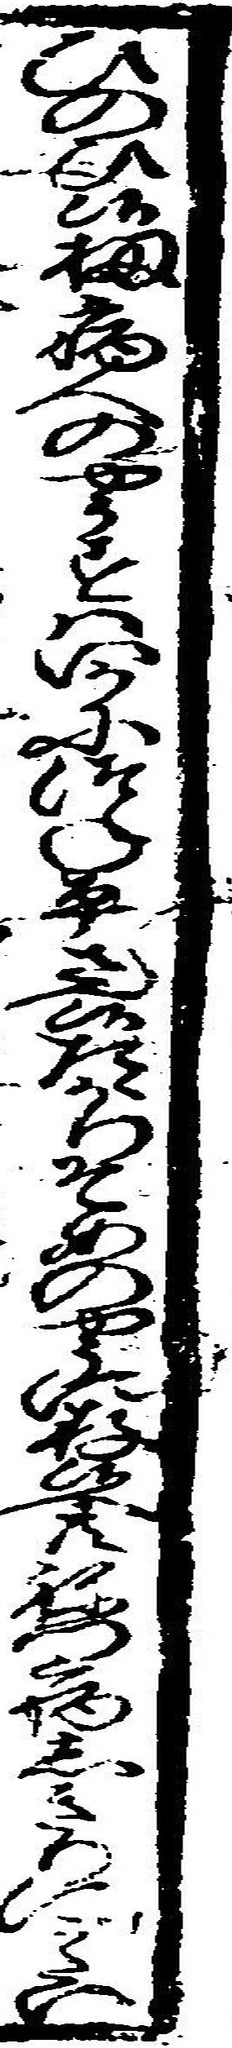ひのひ候扨病人のやうすはいかにつね平さ也候たゝかりそめのやうに存候へ共ねつ病しきりにごたい
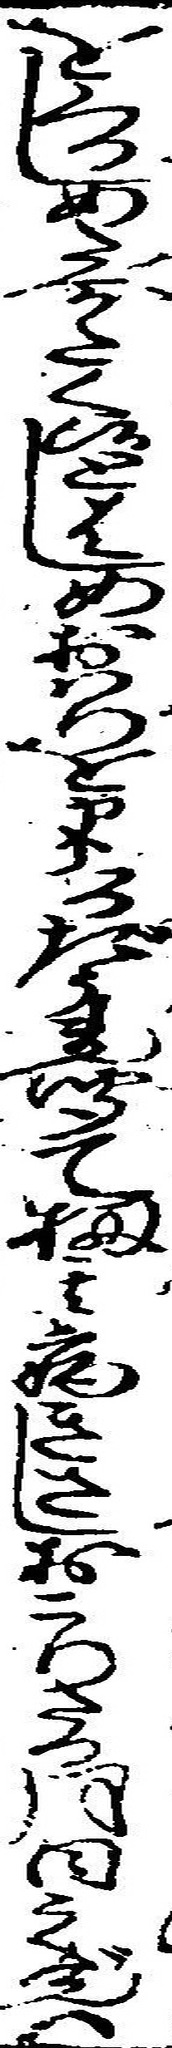をくるしめたへかたく候とはしめおはりを申上るだうまん聞て扨其病きさしおこりたる月日こくげんは
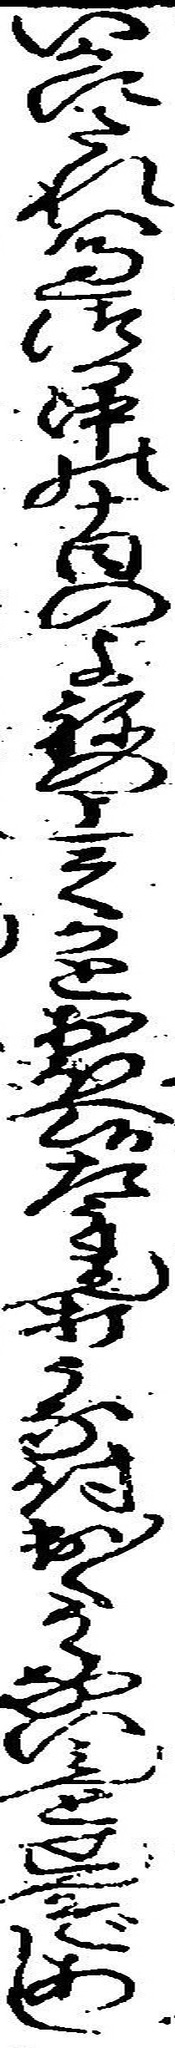いかにたれは過つる中の十日のよねの上こくかとおほへ候たうまんうちうな付〳〵うらないみんとせんぞあし
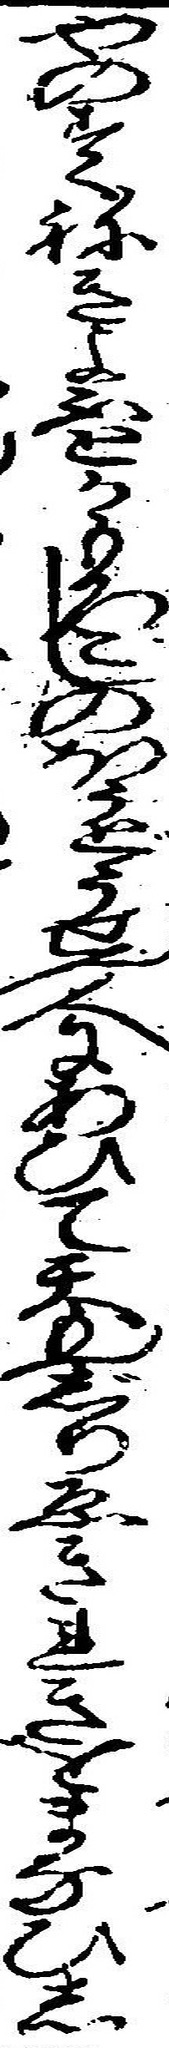やのすくねきよふとかもろこしのほうどうせん人にあひて天もんじりゑきれきをまなひし
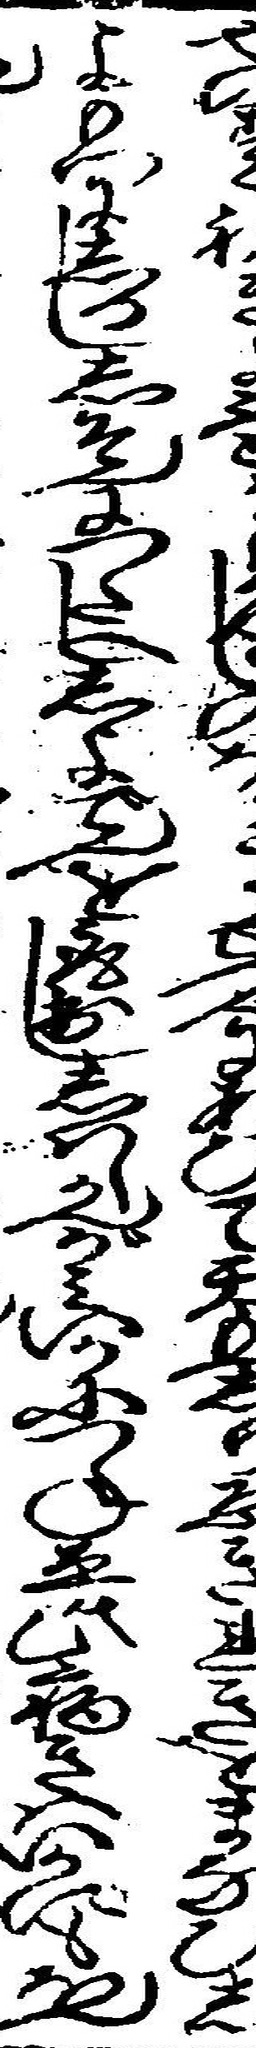よもつにしるししそんにつたへししよでんを取出ししはしかんがみいかにつね平此病きはいかにもほん
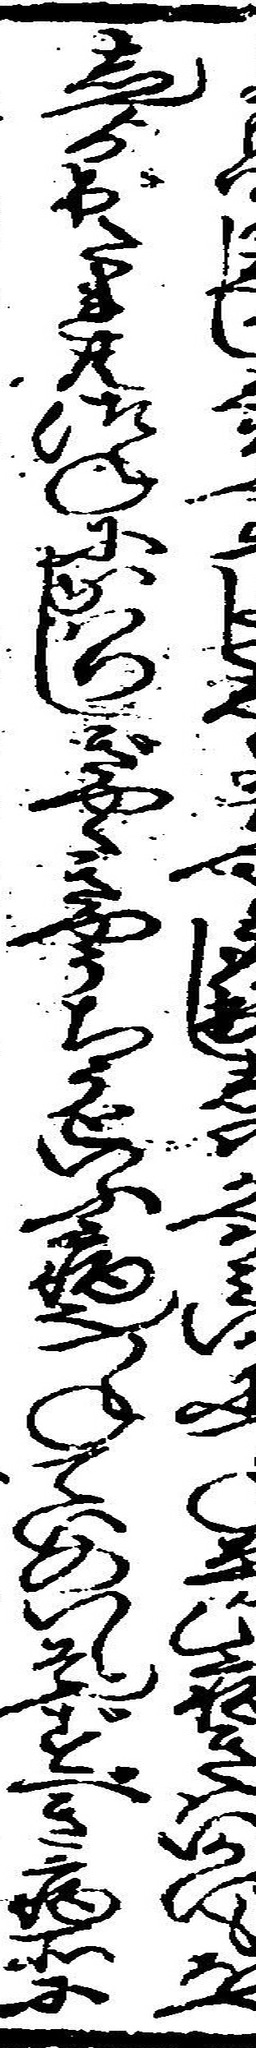しんゟ出たれ共つねにかはりしぎやくきやうちうといふ病也つねていのいしそんずべき病所に
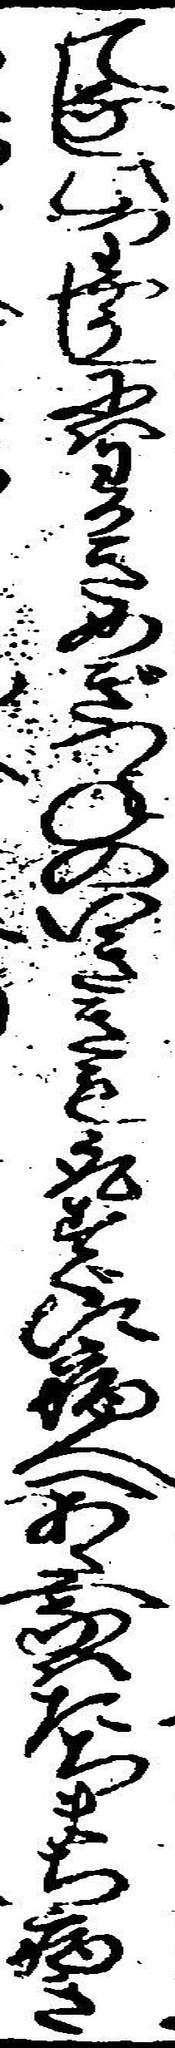てなし此りやうしにはわかきめぎつねのいききも取すぐに病人へあたへなはたちまち病き
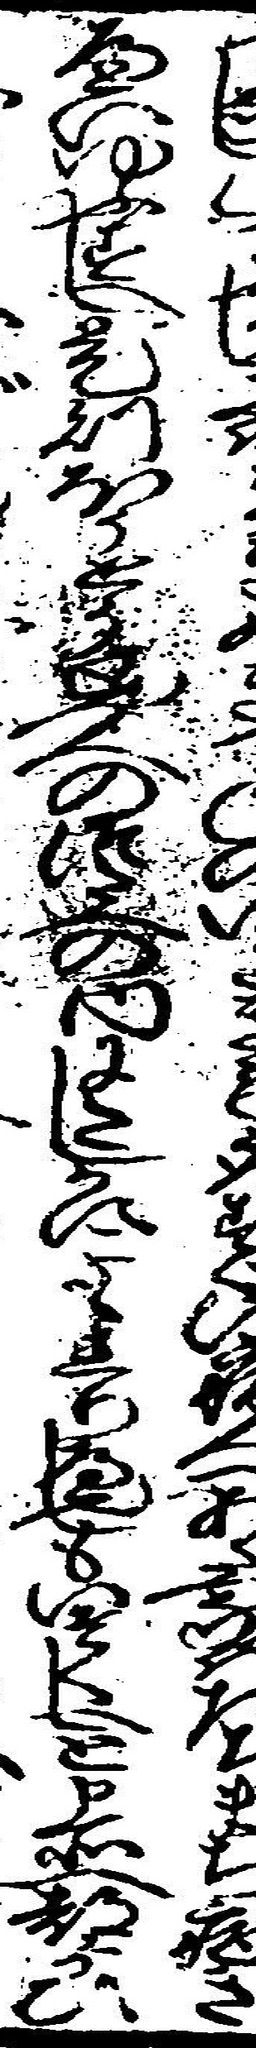へいゆふすへし是則ほうとうせん人のつたへの内にたしかにこもれりへんしもいそくへしと申所へ都ゟひ
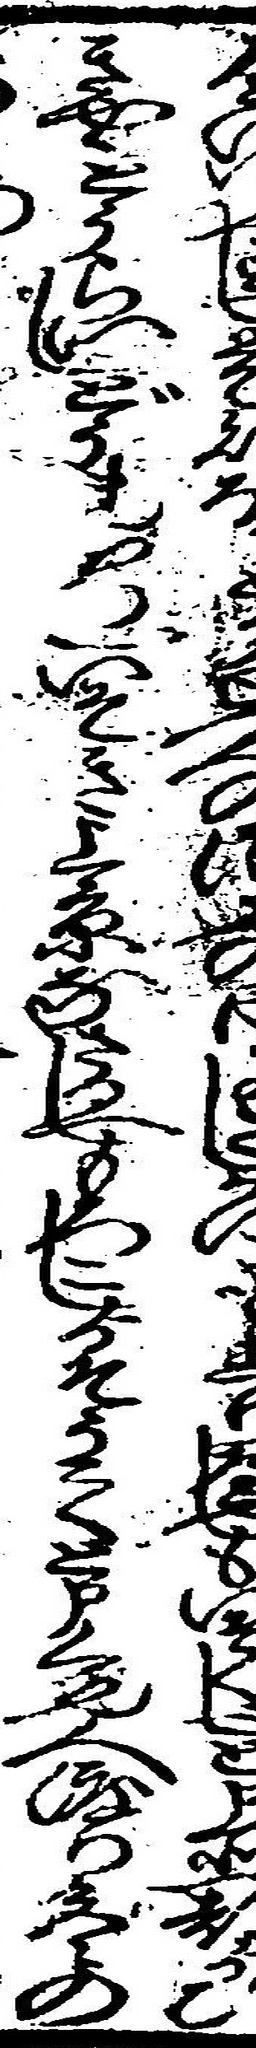きやくとうらいしどうまんいそき上京なさるへしもろこしゟそうこく申くわん人渡り色々の
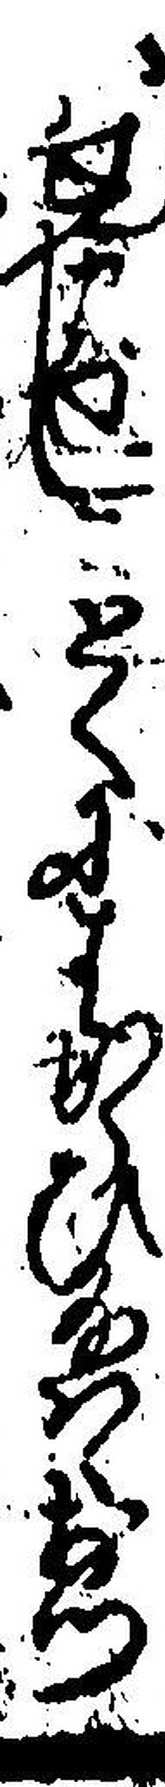…せん申せしことくにはからひ給はゝおつ

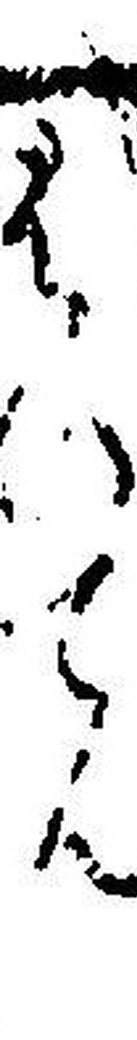はいてん
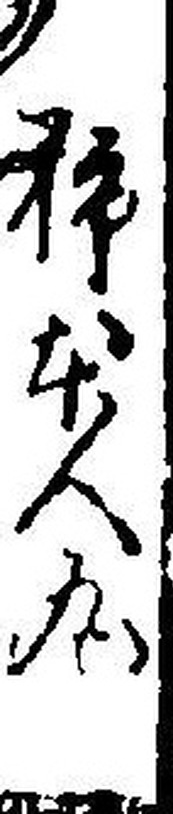柿本人丸
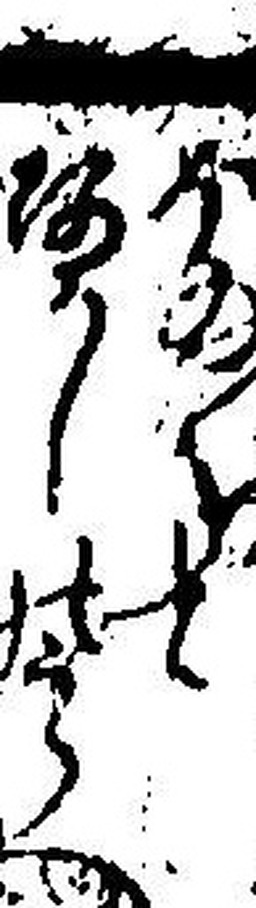あかしのうら
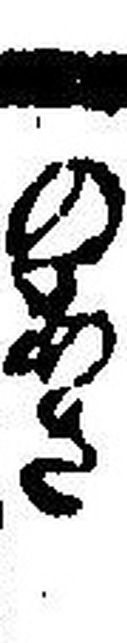のあさ
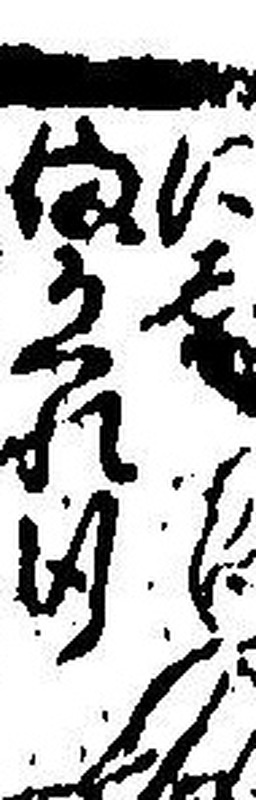まかくれ行
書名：[しのだづまつりぎつね付あべの清明出生]
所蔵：東京大学総合図書館 General Library in the University of Tokyo, JAPAN
